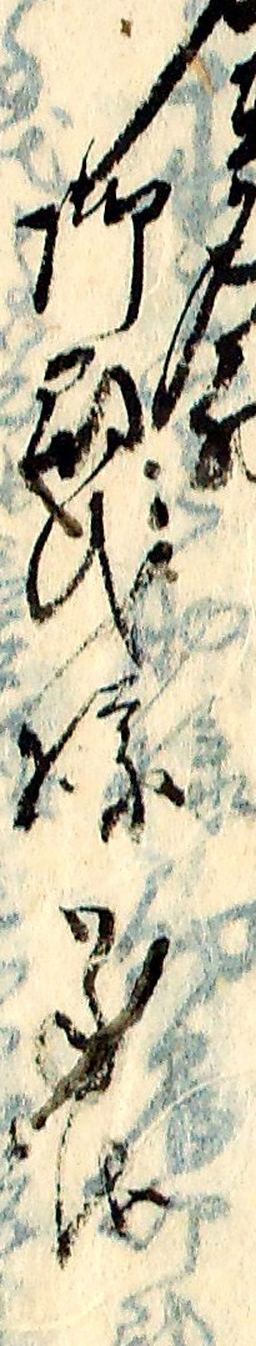御郡代様御手代
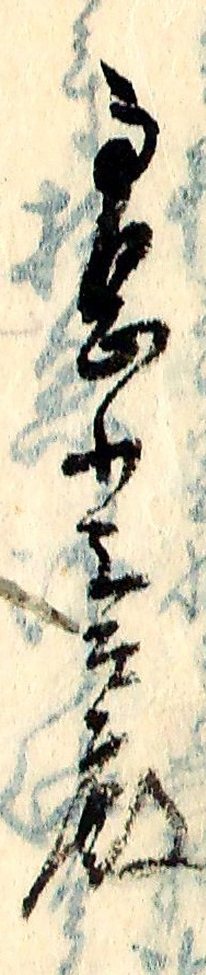高岡小三太殿

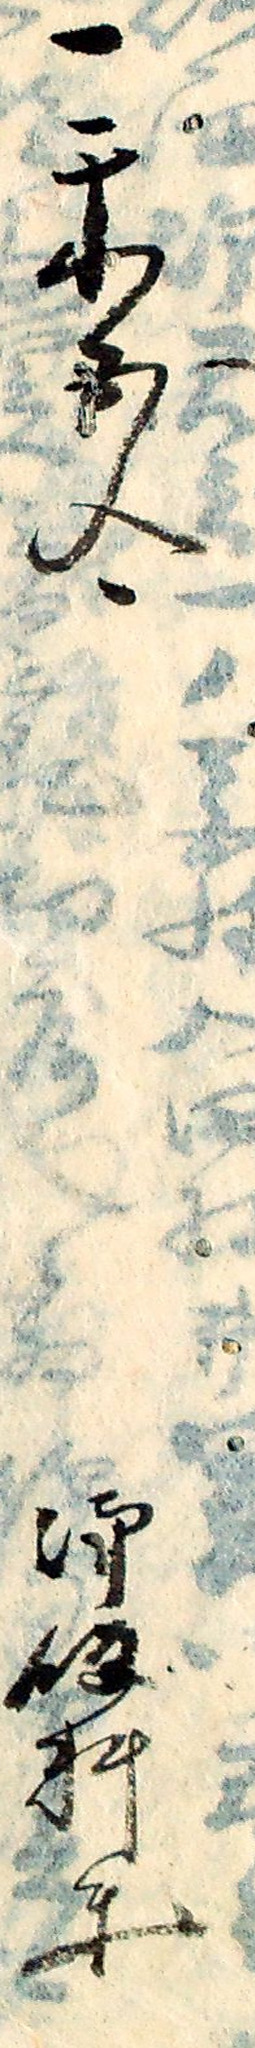一米五合御飯料米
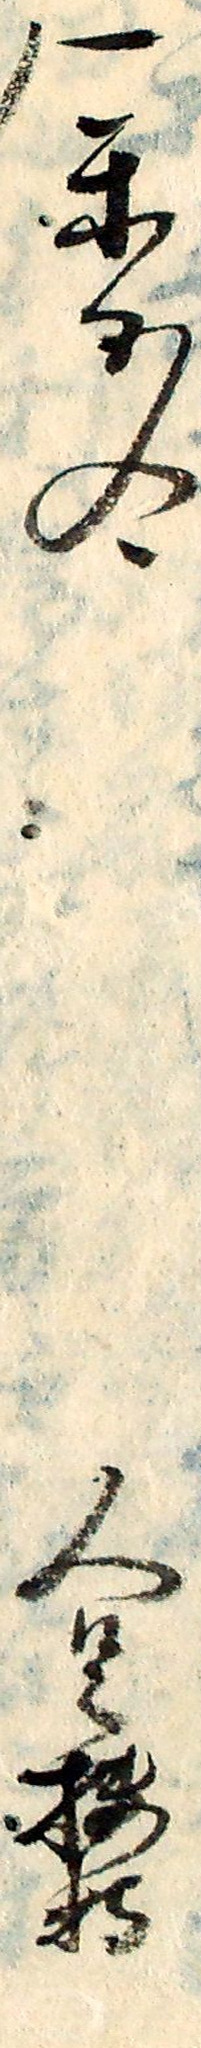一米五合人足扶持
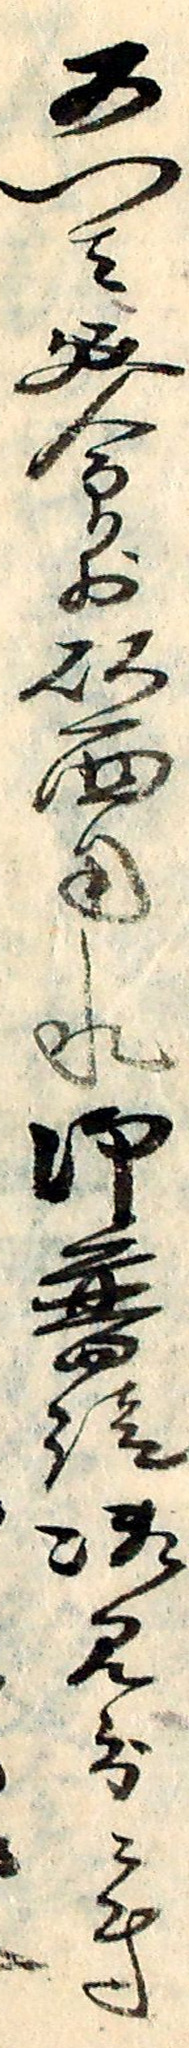右は延命村以西用水御普請御見分に付
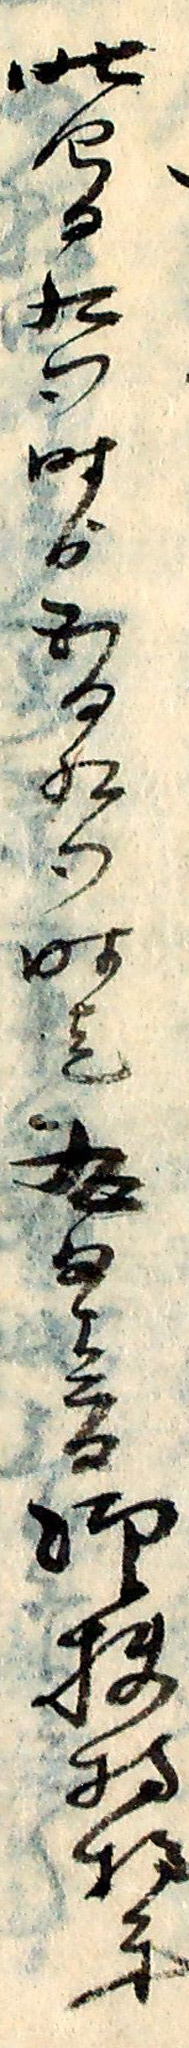昨四日九つ時ゟ五日九つ時迄丸日壱日御扶持持米
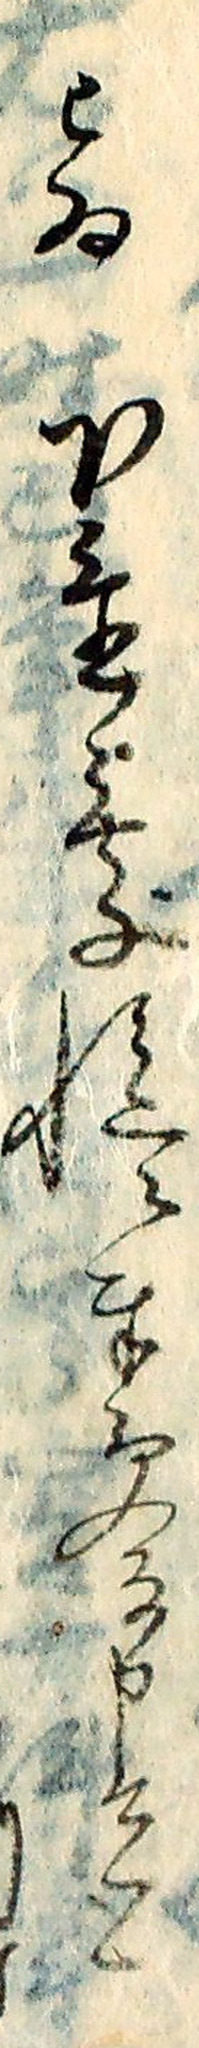被為下置候処慥に奉受取申候以上
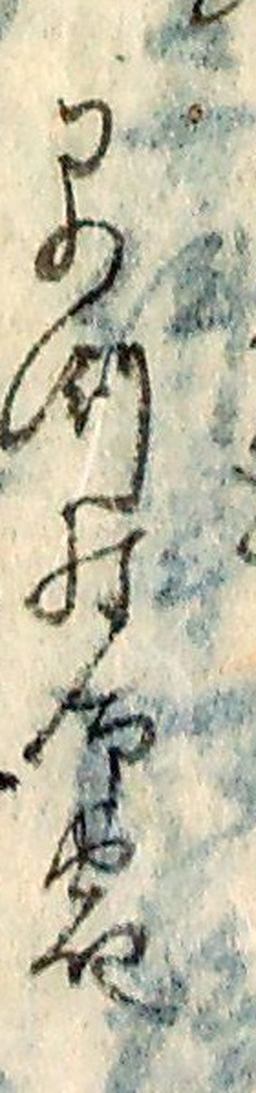早淵村御宿
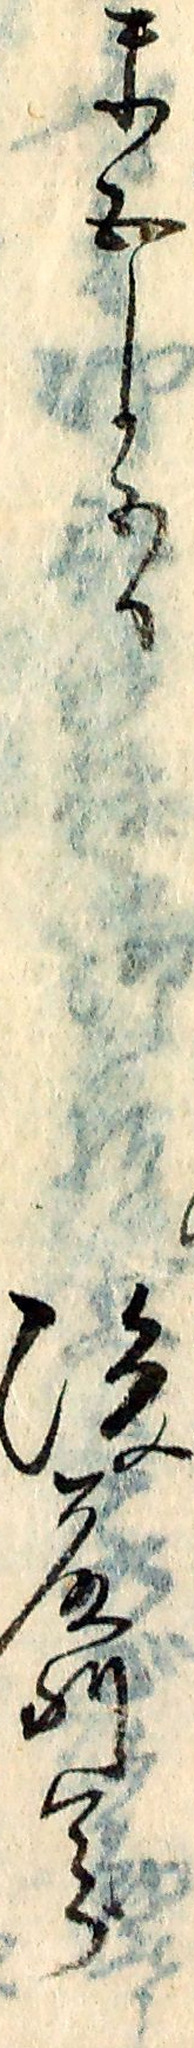未五月五日後藤利八郎
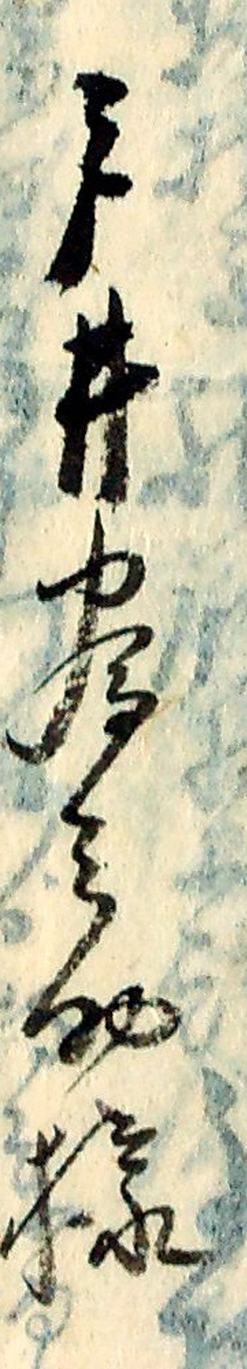戸井為之助様
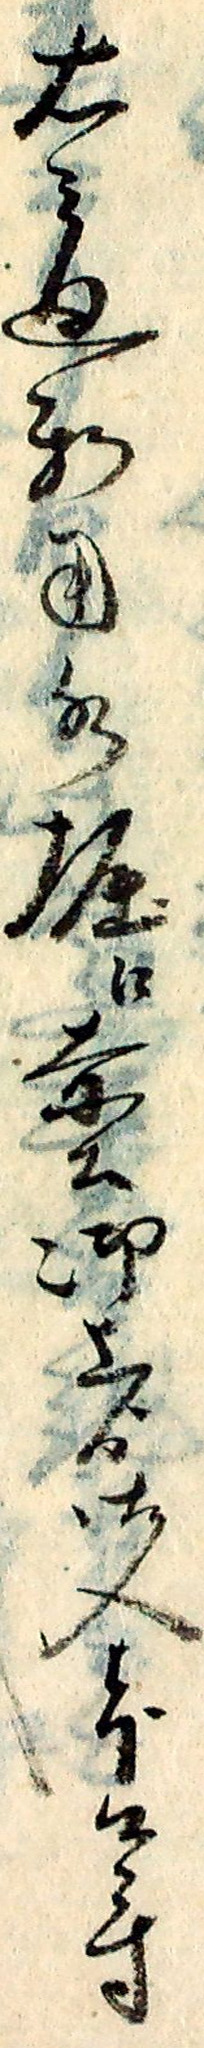右の通新用水堀え赤土御上ゟ御入被下候付
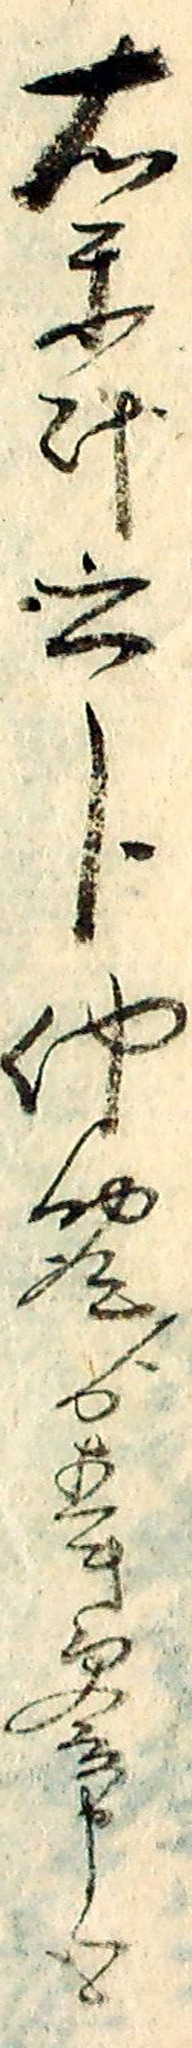右米代六分仲助殿ゟ直き受取申候以上
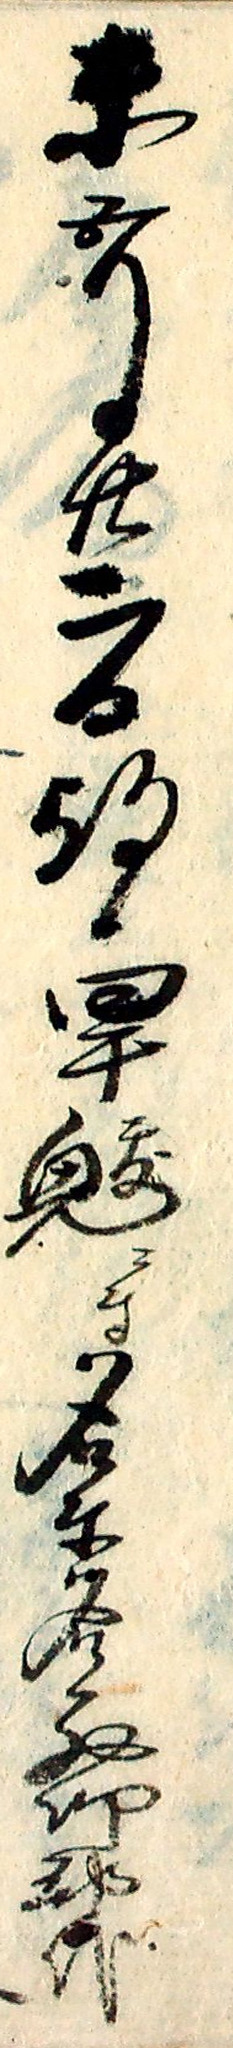未五月廿二日朝旱魃に付名東名西御郡代
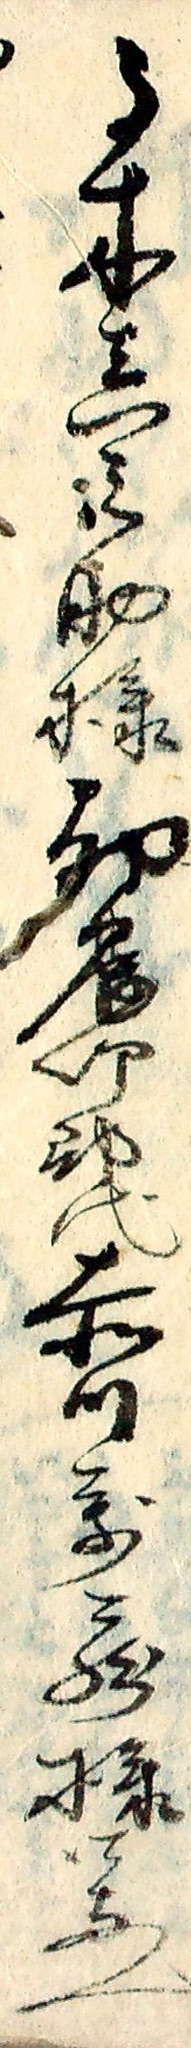高木真之助様勧農御郡代赤川万蔵様御両人
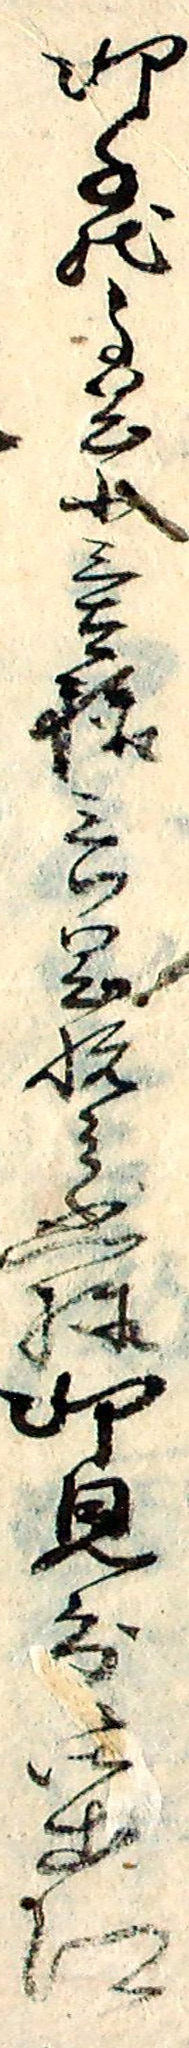御手代高岡小三太様三つ岡悦之丞様御見分に御出郷
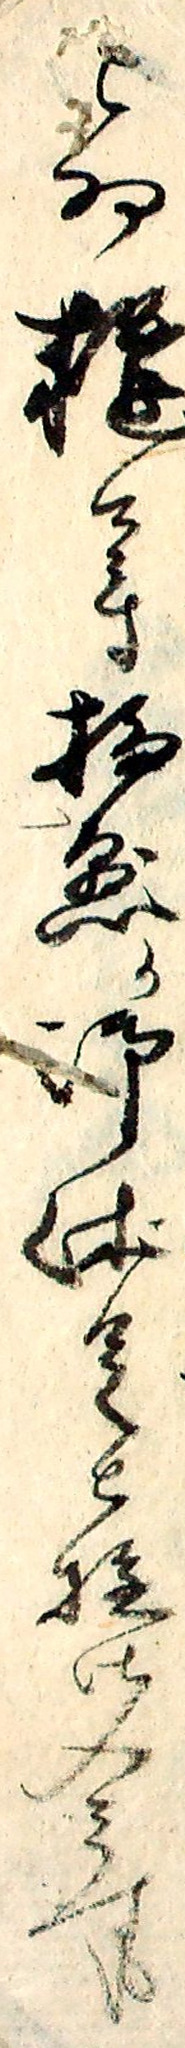被為遊候付指懸り御休足被遊御入御座候
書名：諸御願書控(後藤氏壱番）
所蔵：鳴門教育大学 Naruto University of Education
